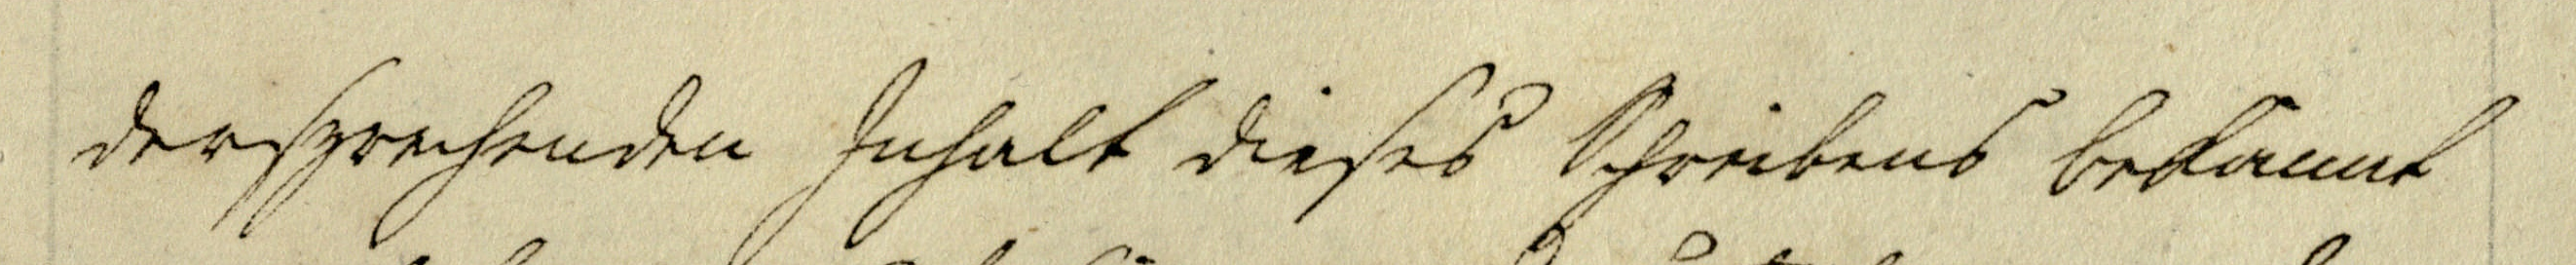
dersprechenden Inhalt dieses Schreibens bekannt
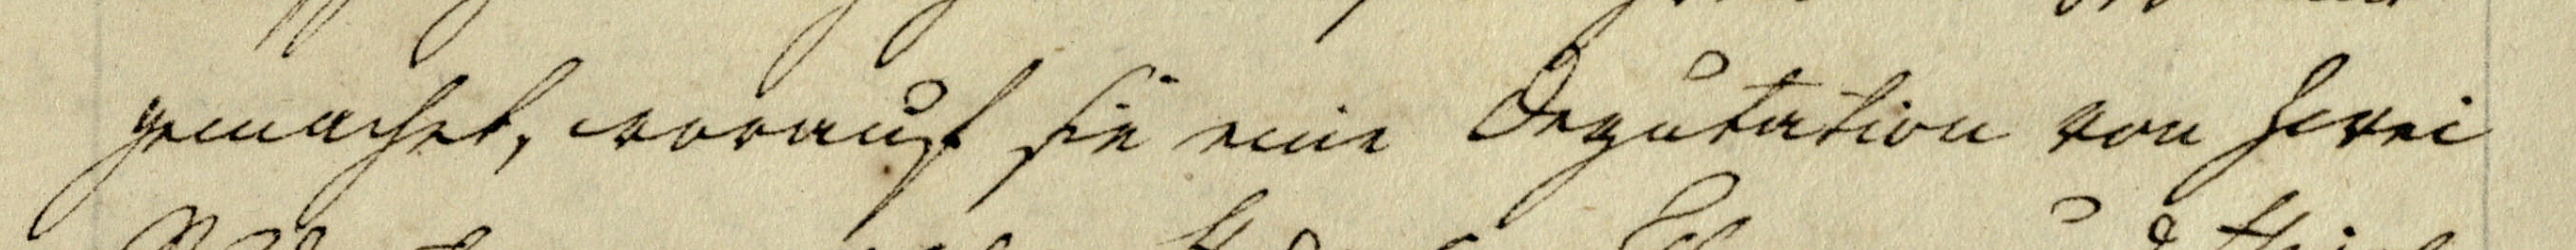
gemachet, worauf sie eine Deputation von zwei
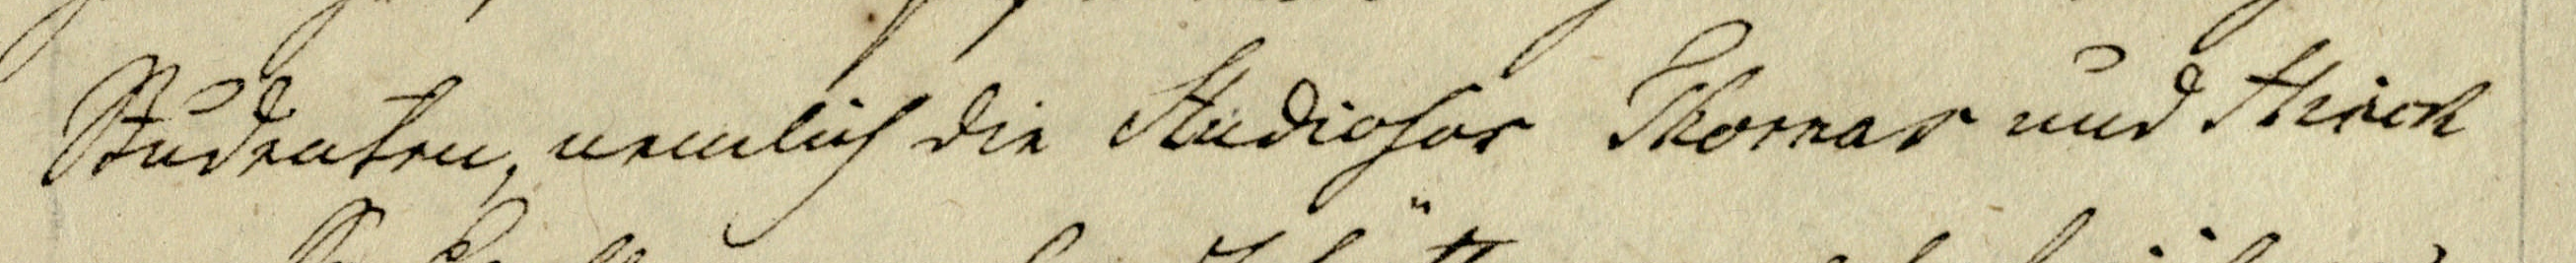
Studenten, nemlich die Studiosos Thomas und Hinck
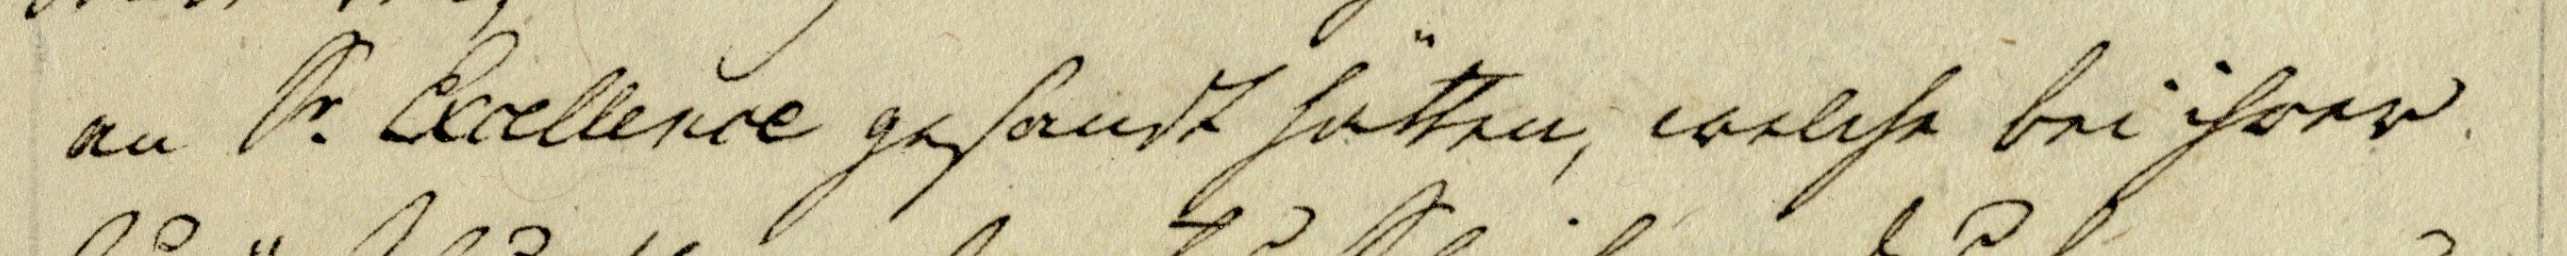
an Sr. Excellence gesandt hätten, welche bei ihrer
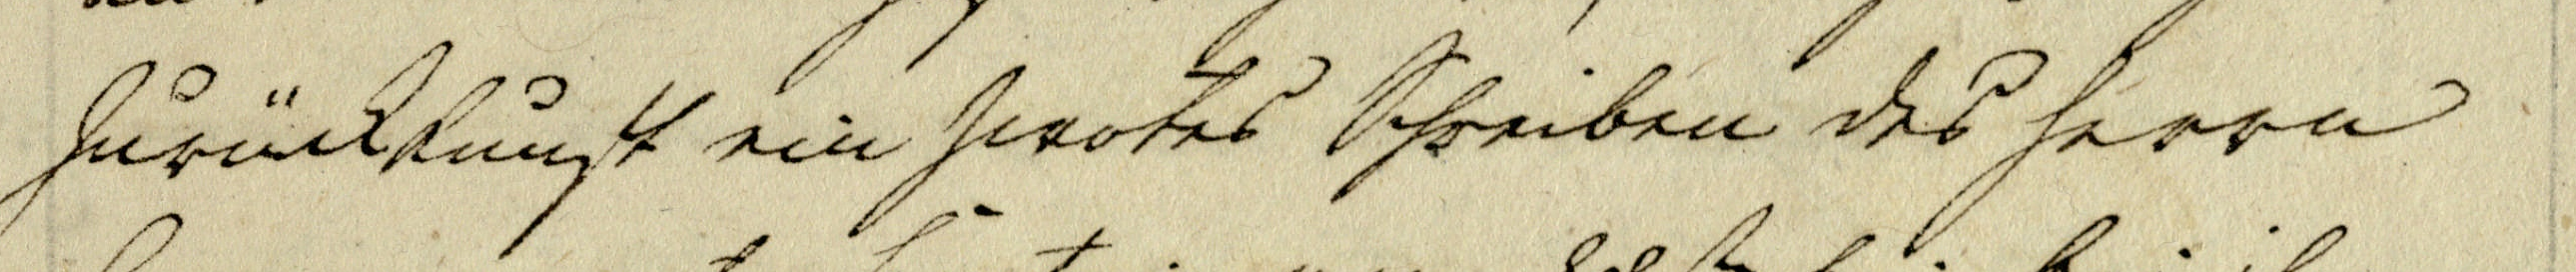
Zurückkunft ein zwotes Schreiben des Herrn
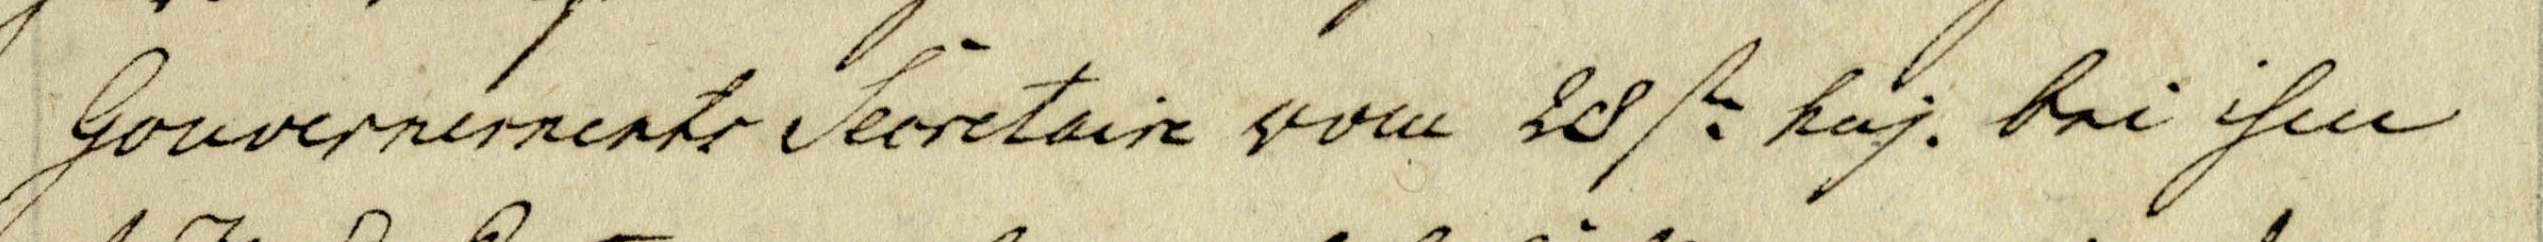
Gouvernements Secretaire vom 28 sten huj. bei ihm
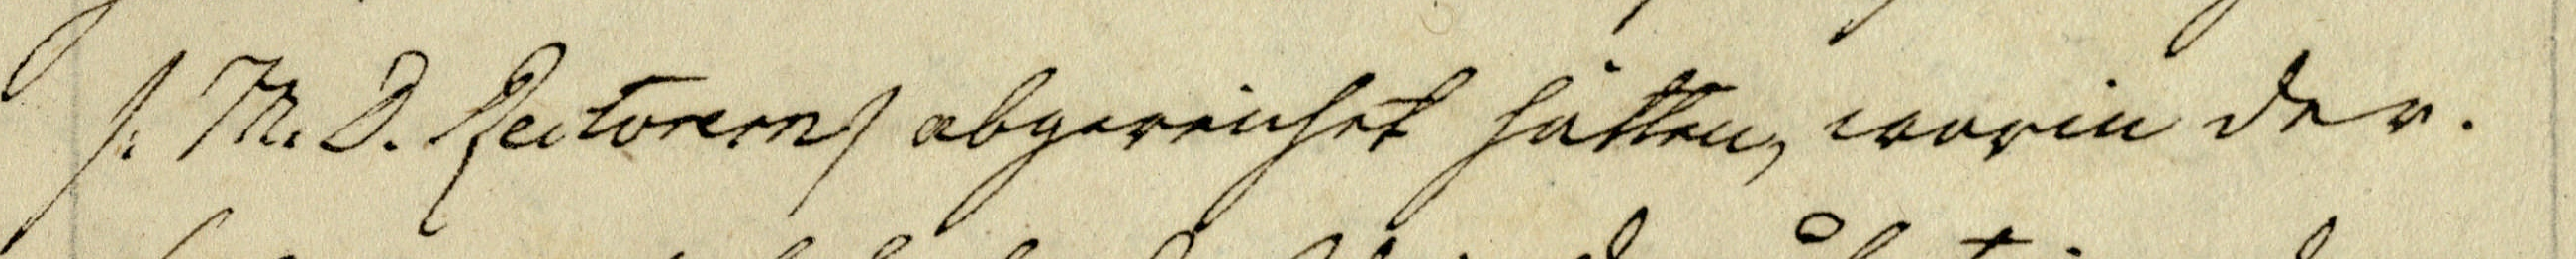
/: M. D. Rectorem / abgereichet hätten, worin der¬
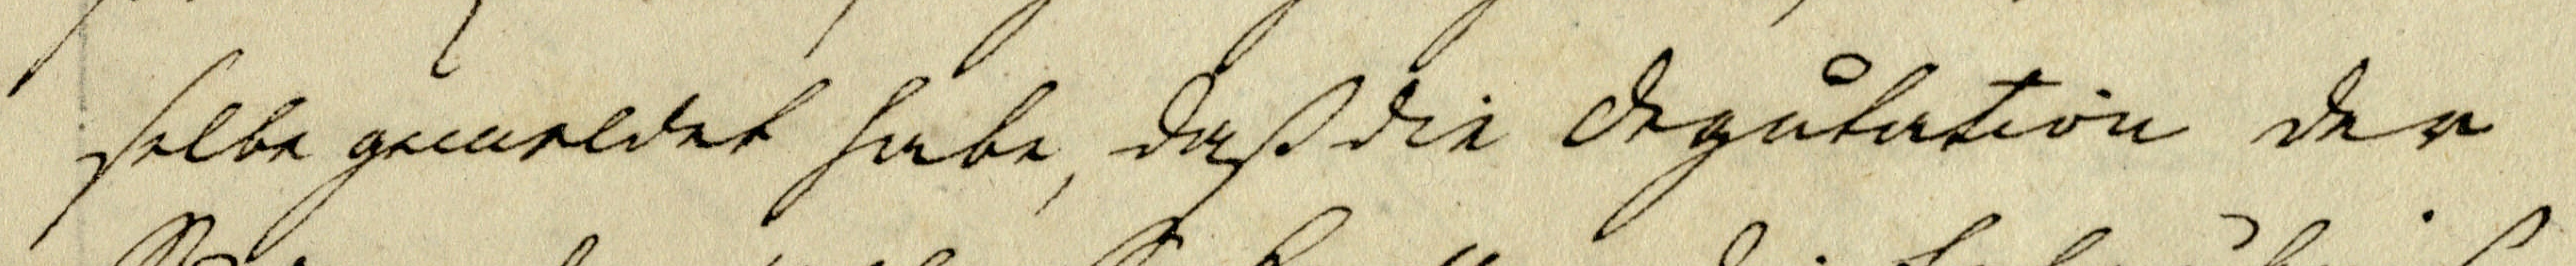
selbe gemeldet habe, daß die Deputation der
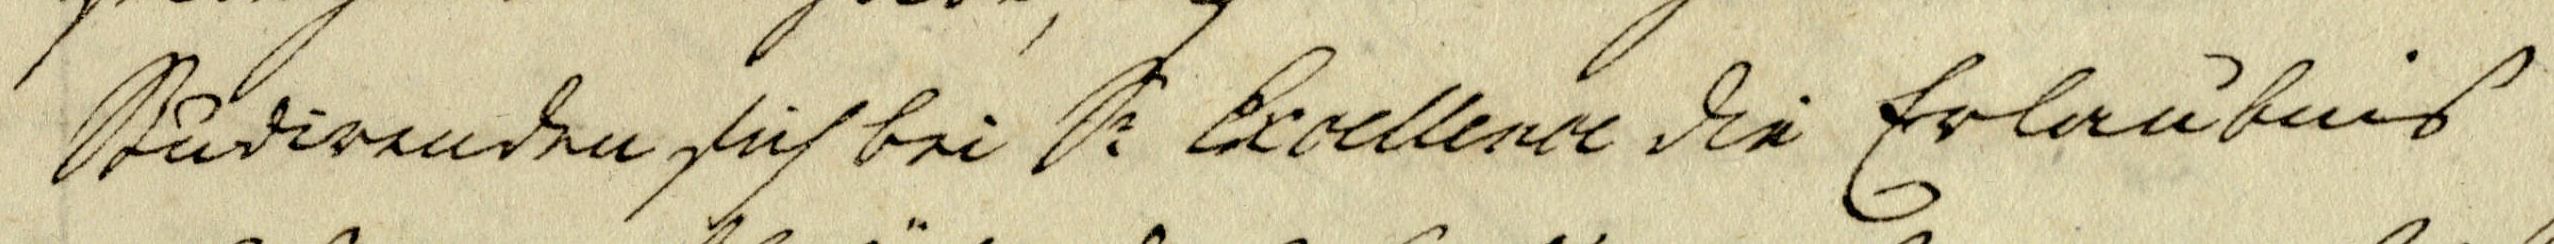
Studirenden sich bei Sr Excellence die Erlaubnis
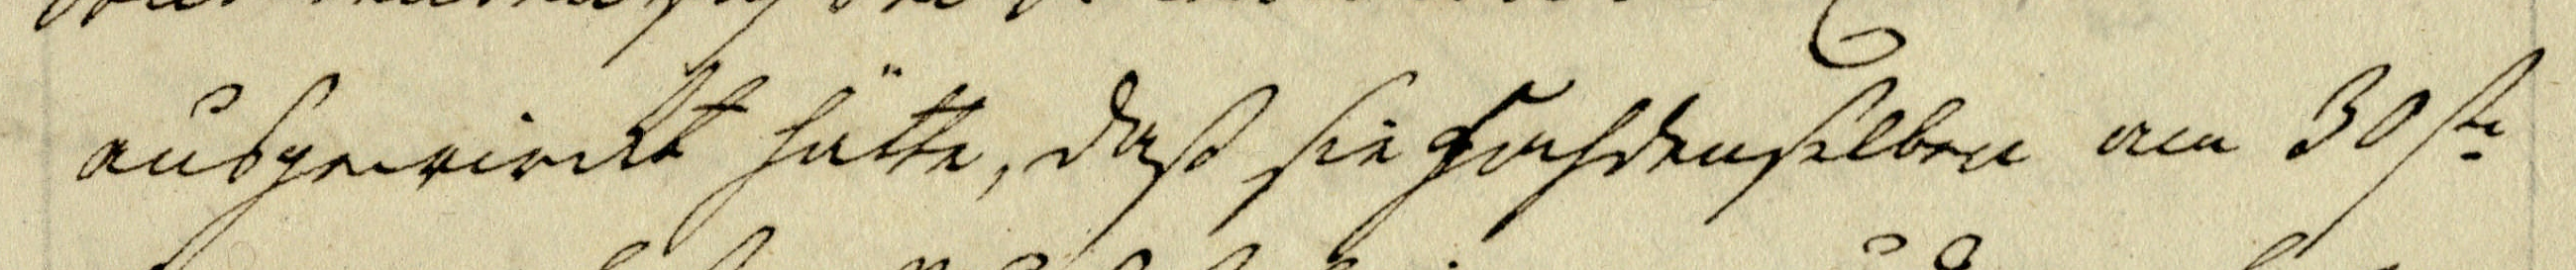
ausgewirckt hätte, daß sie Hochdenselben am 30 ste.
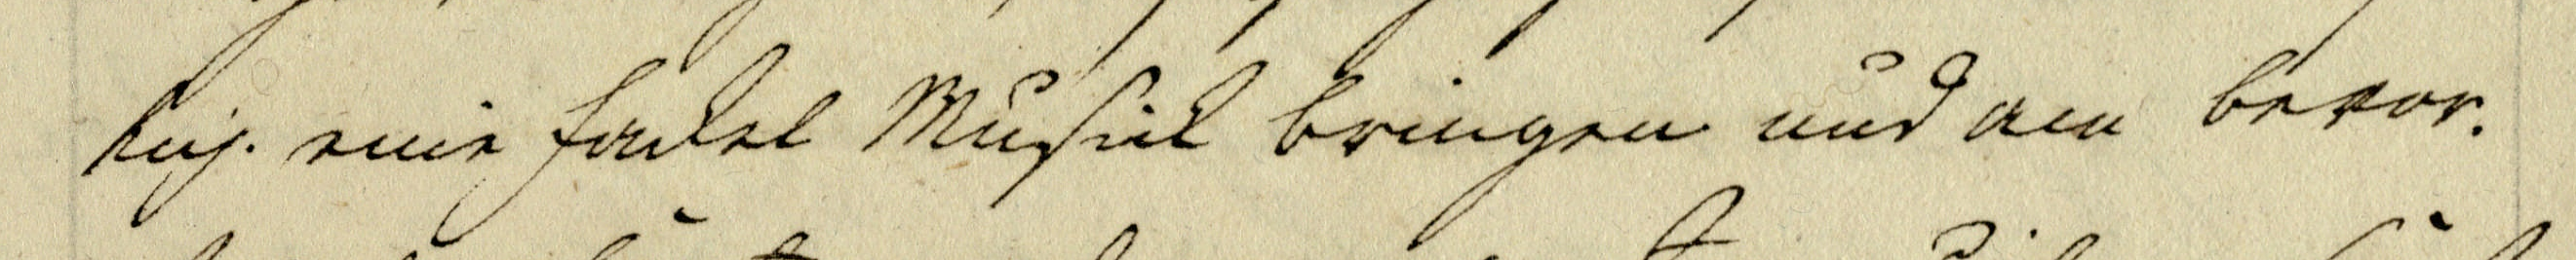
huj. eine Fackel Musick bringen und am bevor¬
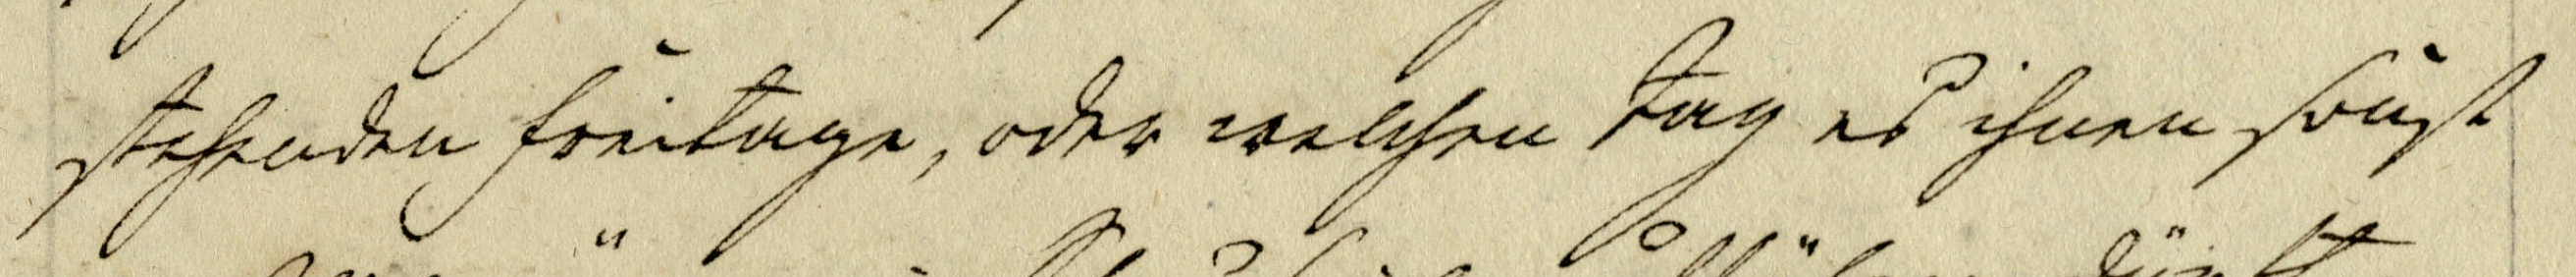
stehenden Freitage, oder welchen Tag es ihnen sonst
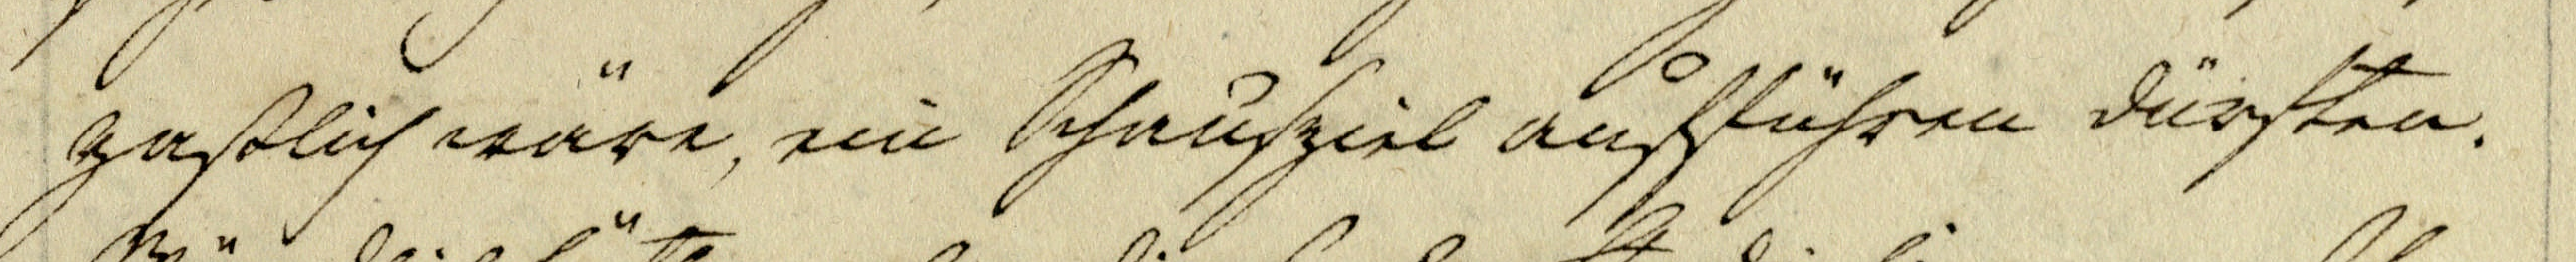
paßlich wäre, ein Schauspiel anfführen dürften.
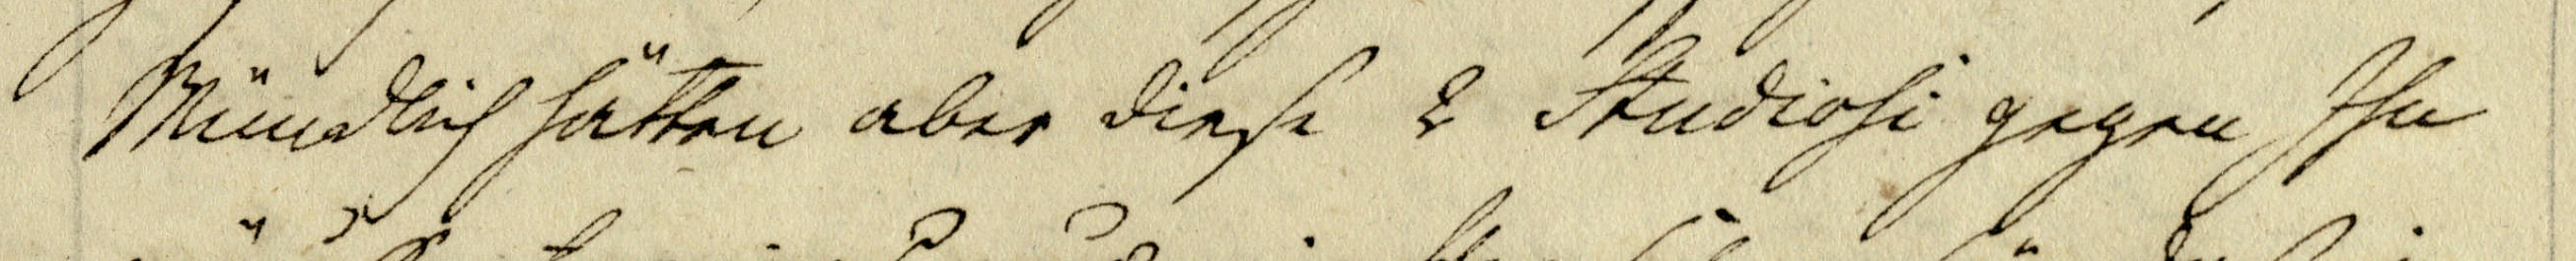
Mündlich hätten aber diese 2 Studiosi gegen Ihn
